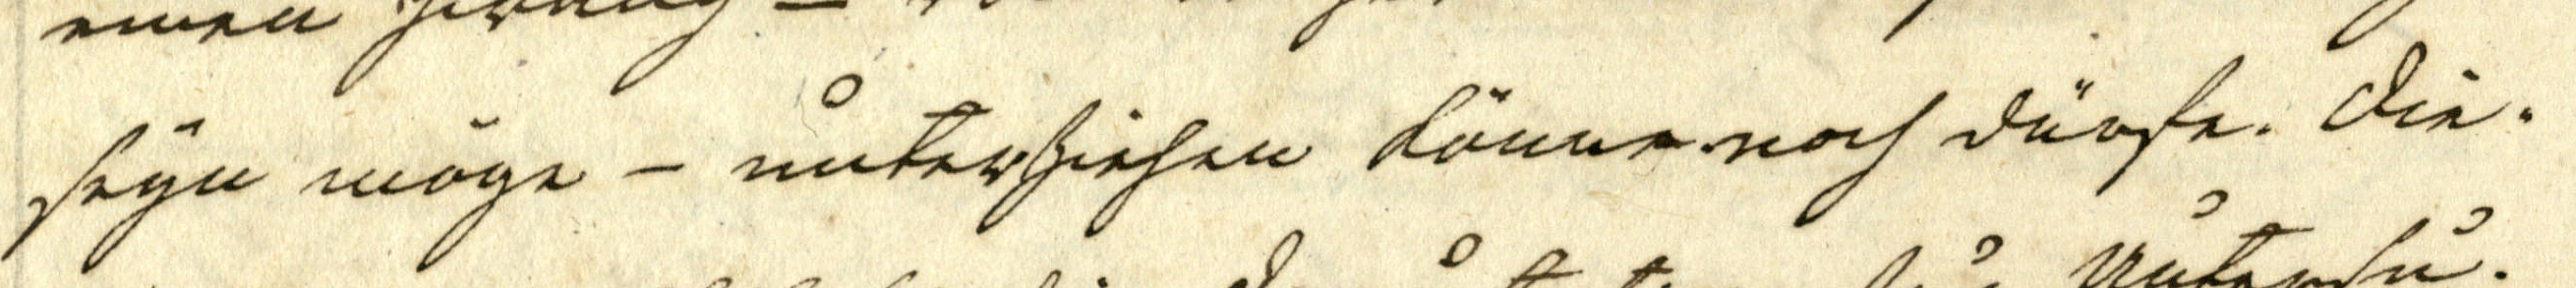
seÿn möge - unterziehen könne noch dürfe. Die¬
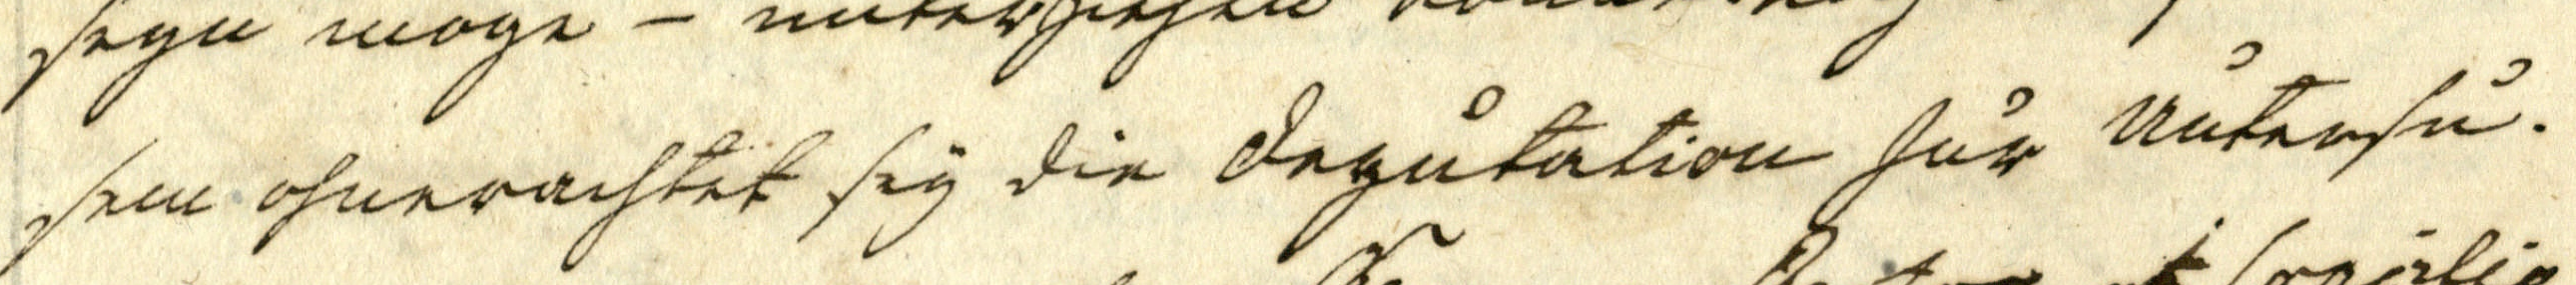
sem ohnerachtet seÿ die Deputation zur Untersu¬
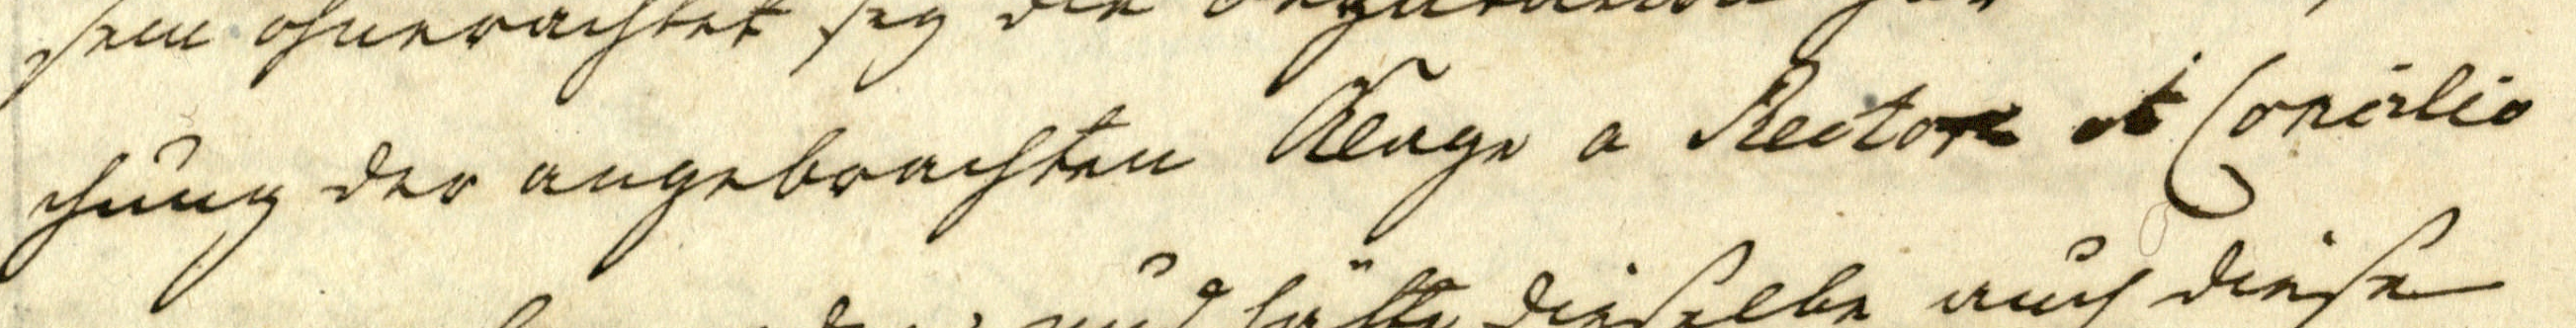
chung der angebrachten Klage a Rectore et Concilio
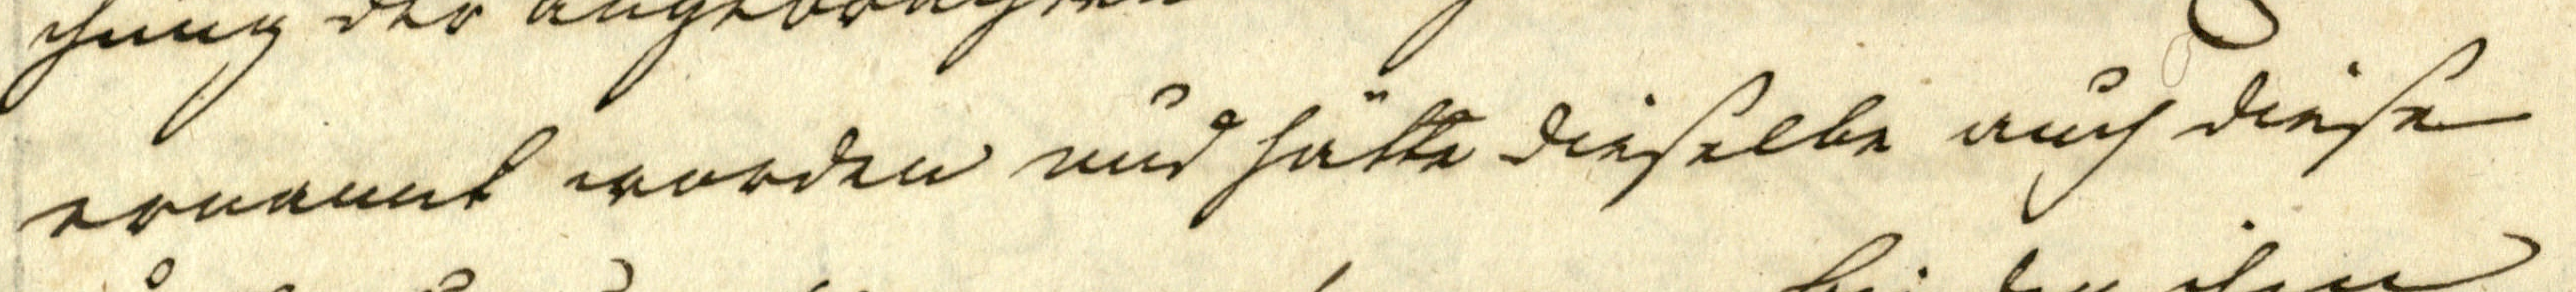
ernannt worden und hätte dieselbe auch diese
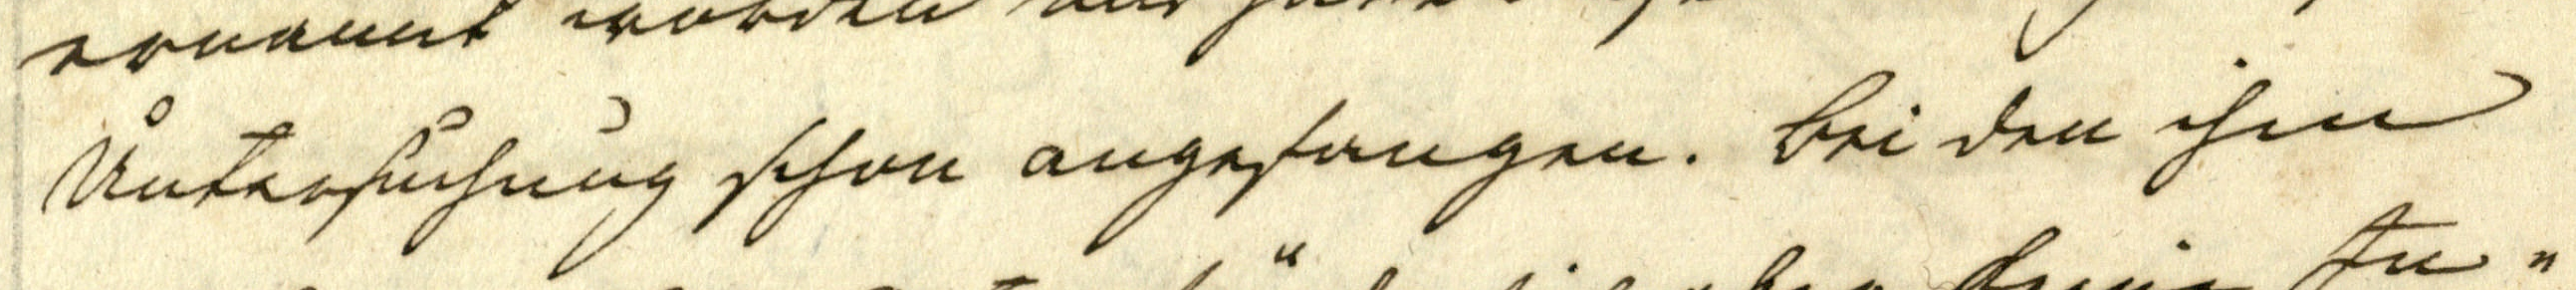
Untersuchung schon angefangen.Bbei den ihm
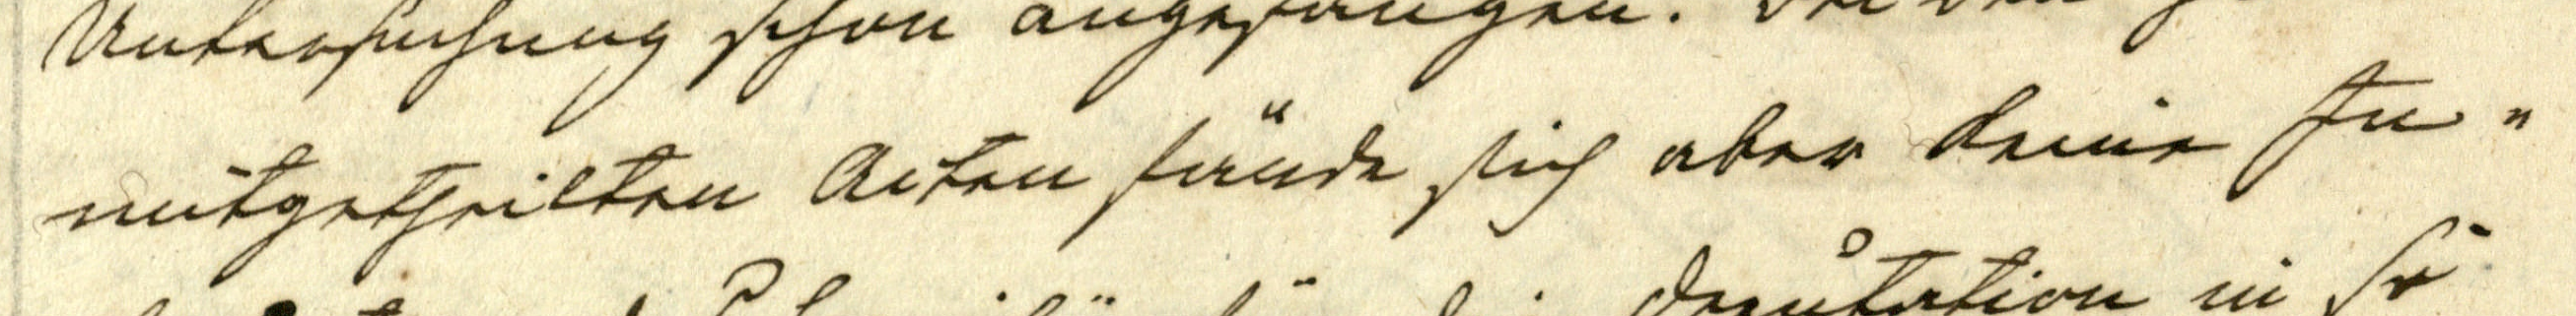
mitgetheilten Acten fände sich aber keine In¬
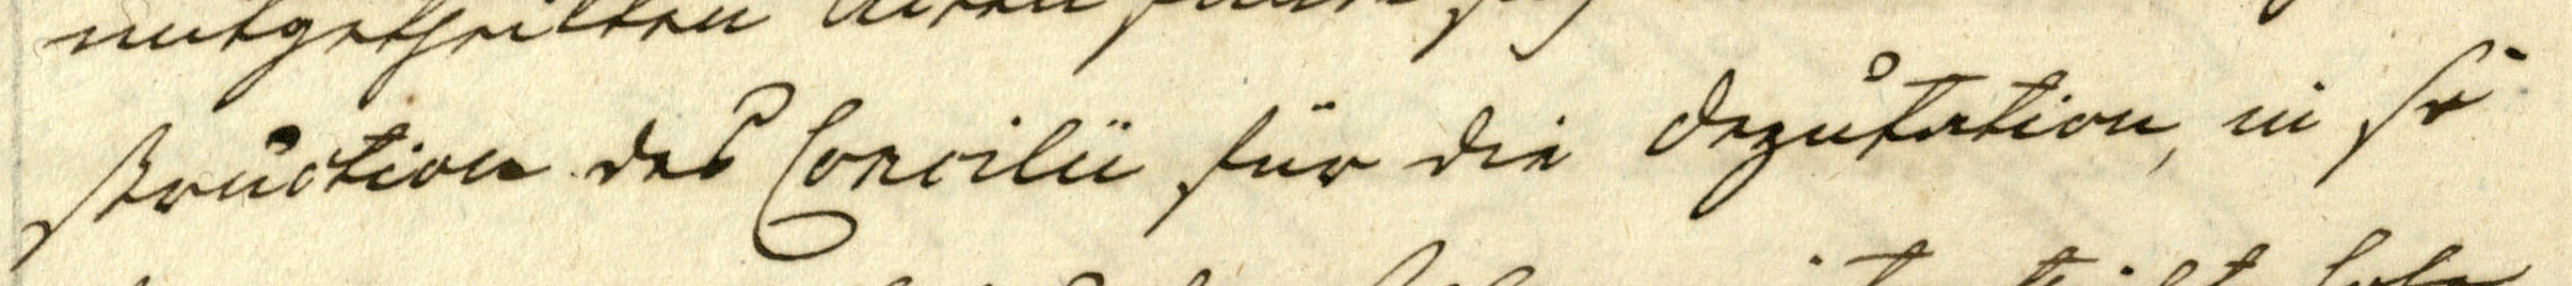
struction des Concilii für die Deputation, in so
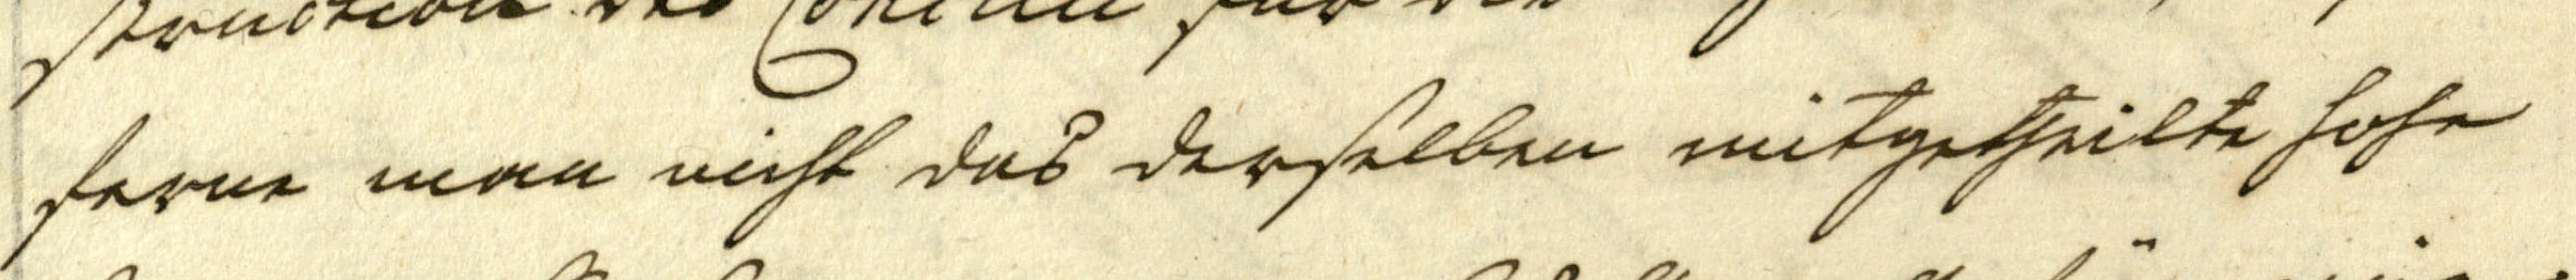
ferne man nicht das derselben mitgetheilte hohe
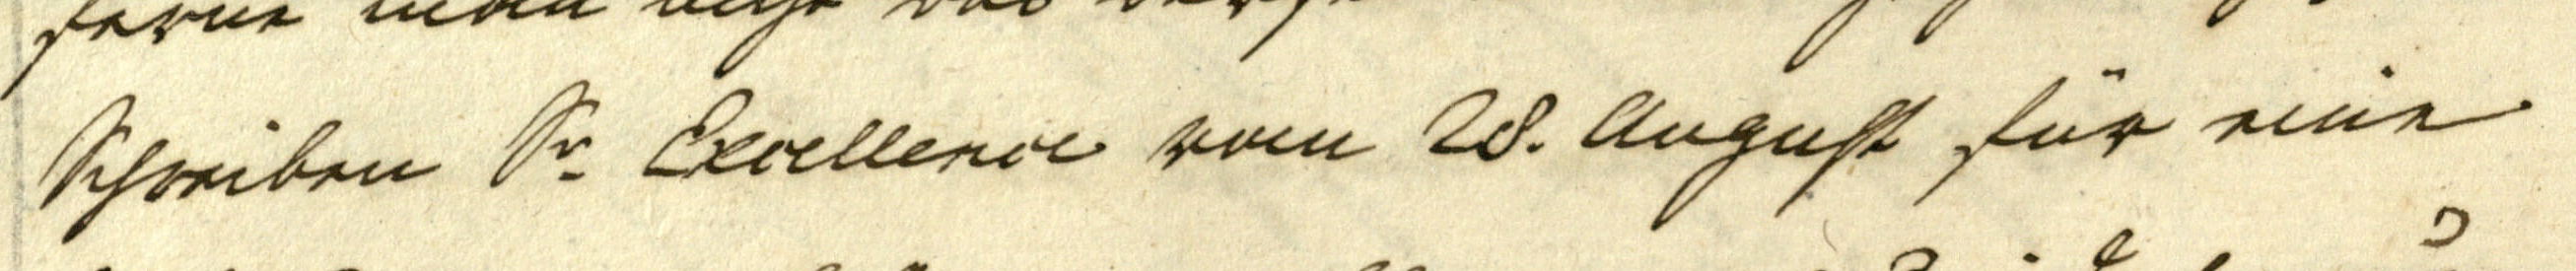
Schreiben Sr Excellence vom 28. August für eine
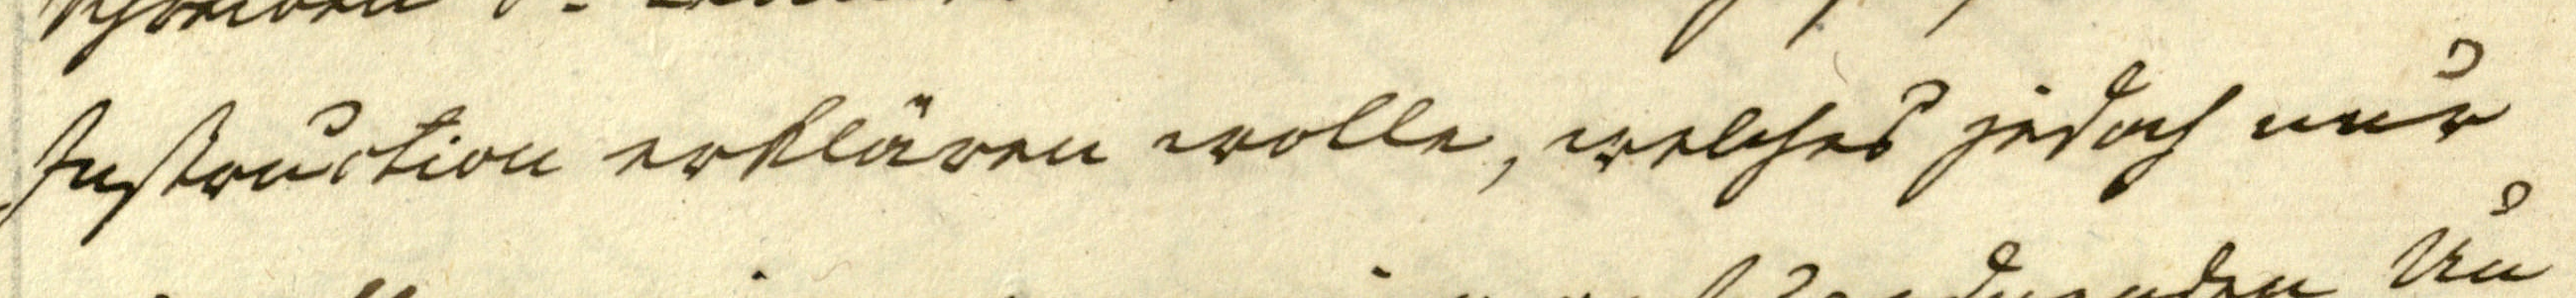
Instruction erklären wolle, welches jedoch nur
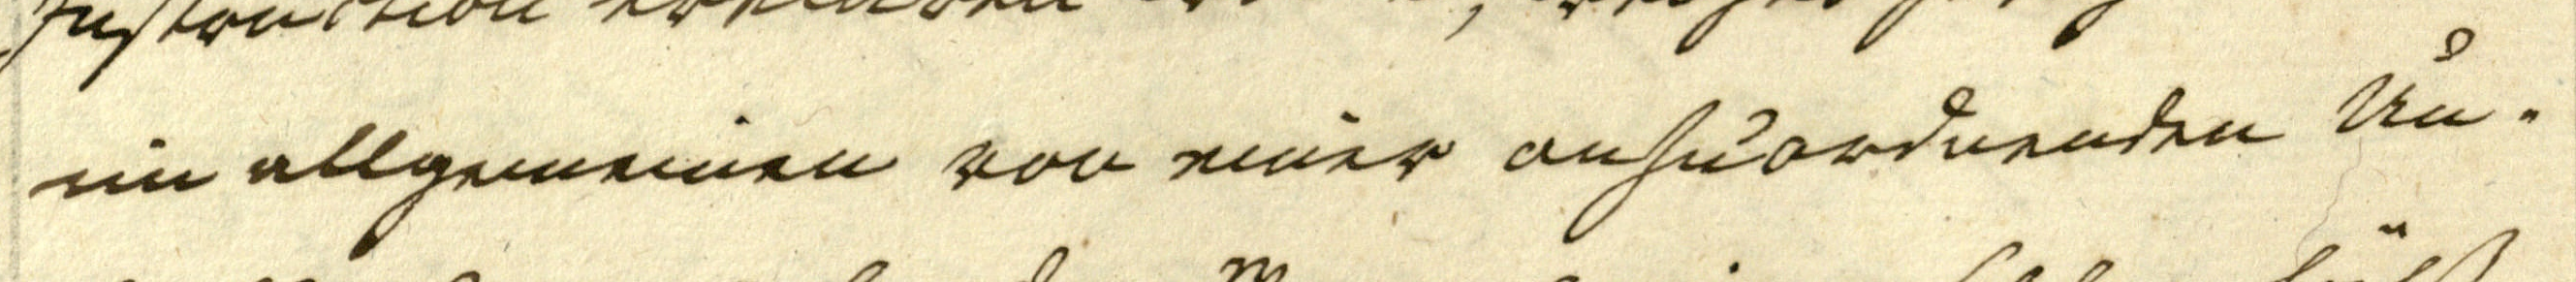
im allgemeinen von einer anzuordnenden Un¬
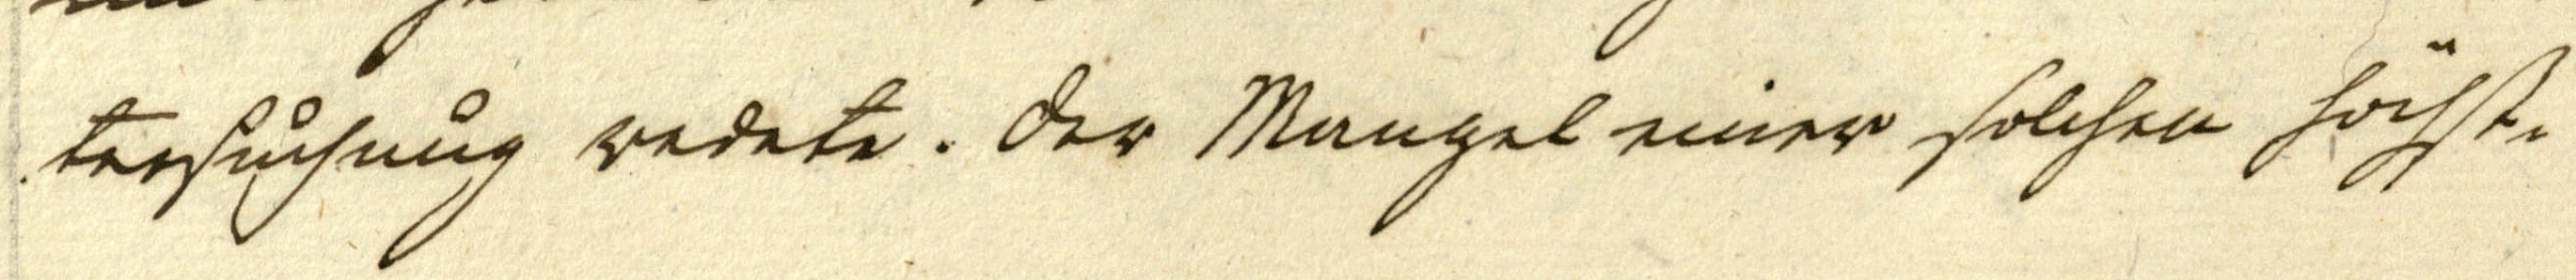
tersuchung redete. Der Mangel einer solchen höchst¬
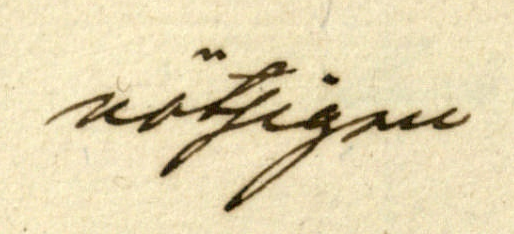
nöthigen
